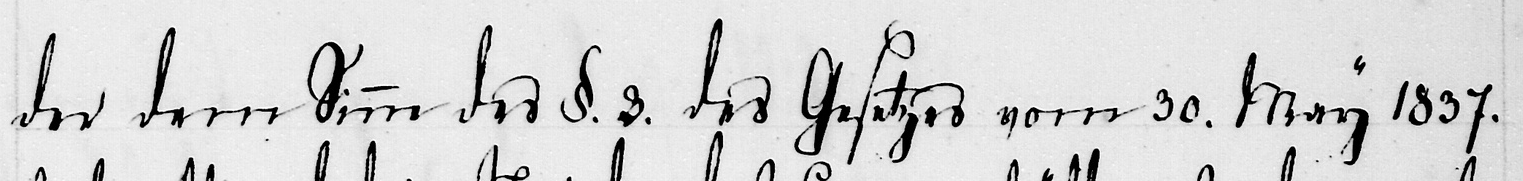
der dem Sinn des §. 3. des Gesetzes vom 30. März 1837.
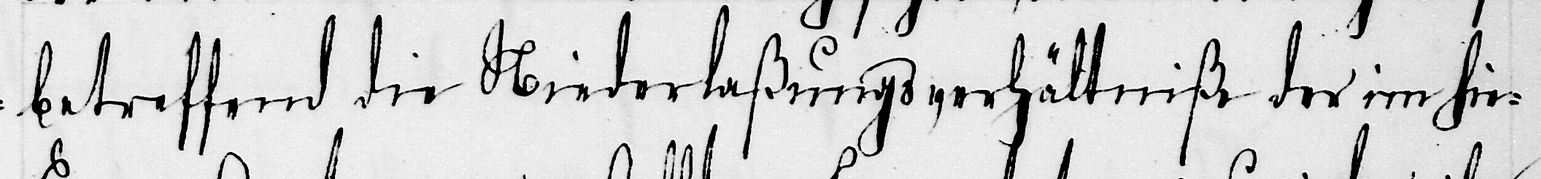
betreffend die Niederlaßungsverhältniße der im hie¬
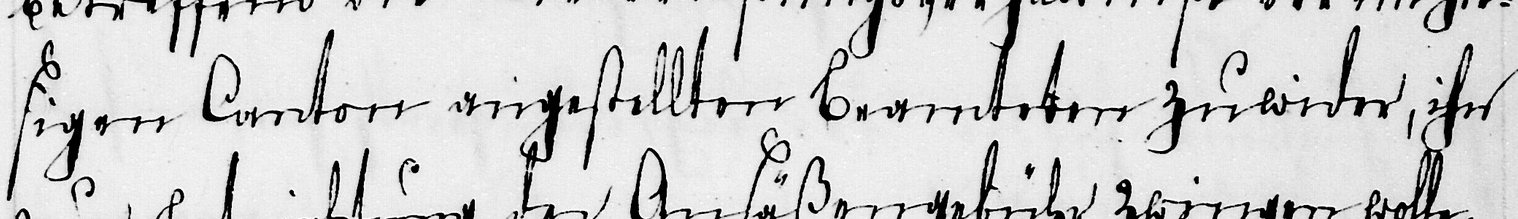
sigen Canton angestellten Beamteten zuwider, ihn
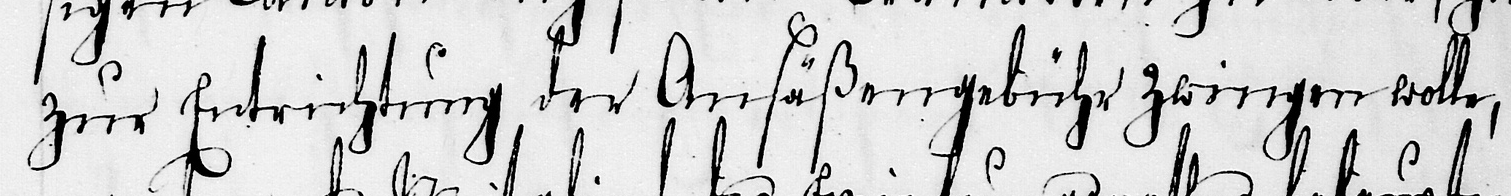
zur Entrichtung der Ansäßengebühr zwingen wolle,
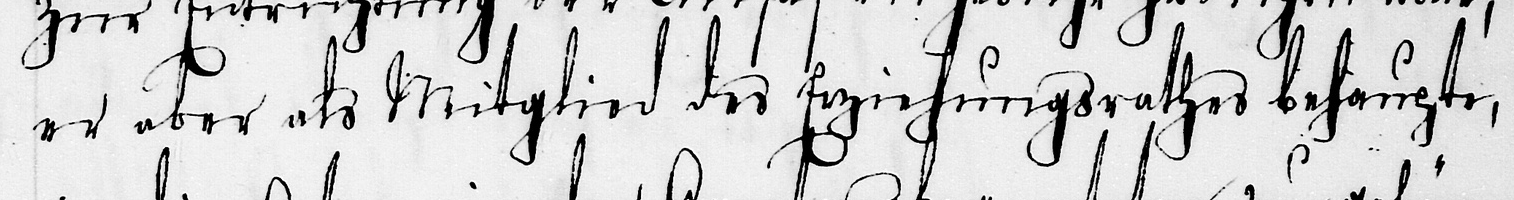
er aber als Mitglied des Erziehungsrathes behaupte,
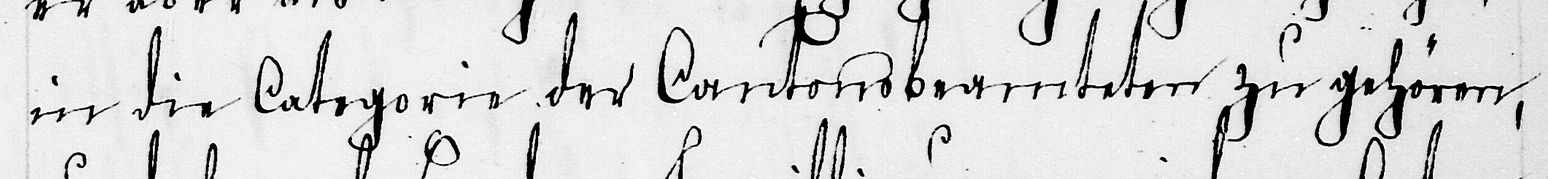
in die Categorie der Cantonsbeamteten zu gehören,
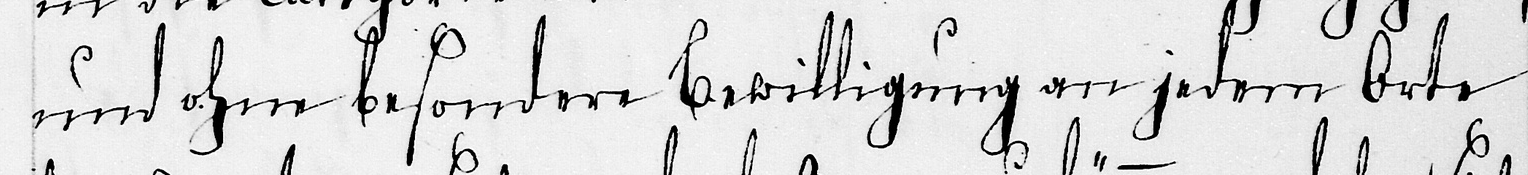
und ohne besondere Bewilligung an jedem Orte
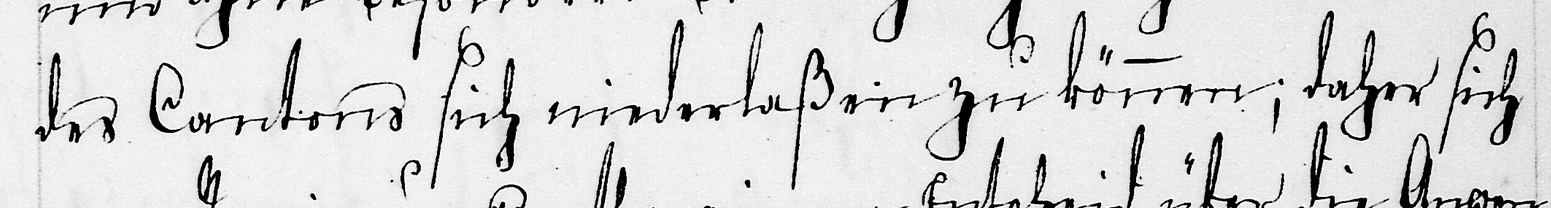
des Cantons sich niederlaßen zu können; daher sich
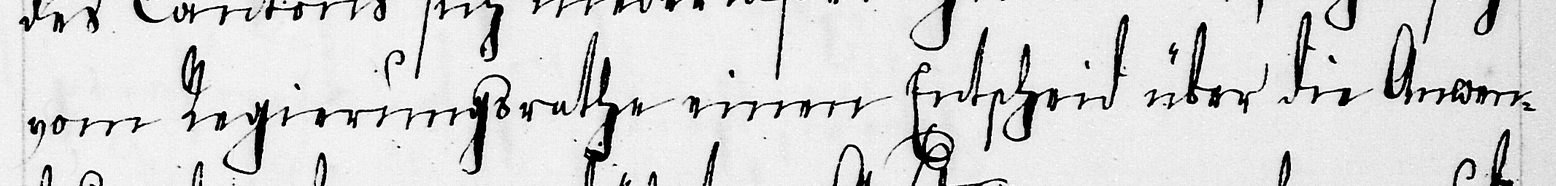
vom Regierungsrathe einen Entscheid über die Anwen¬
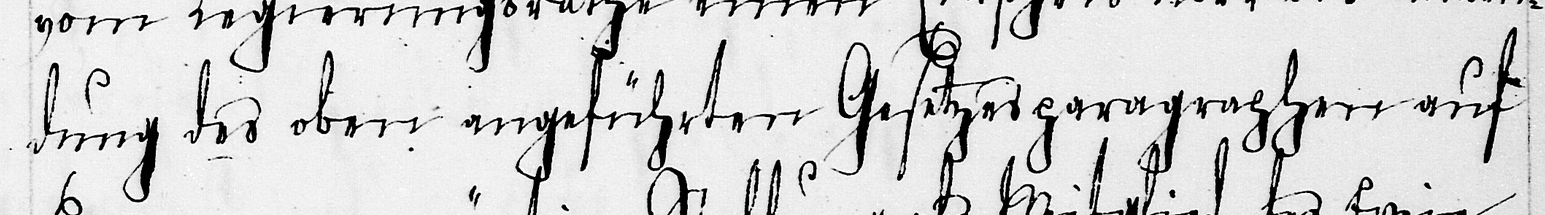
dung des oben angeführten Gesetzesparagraphen auf
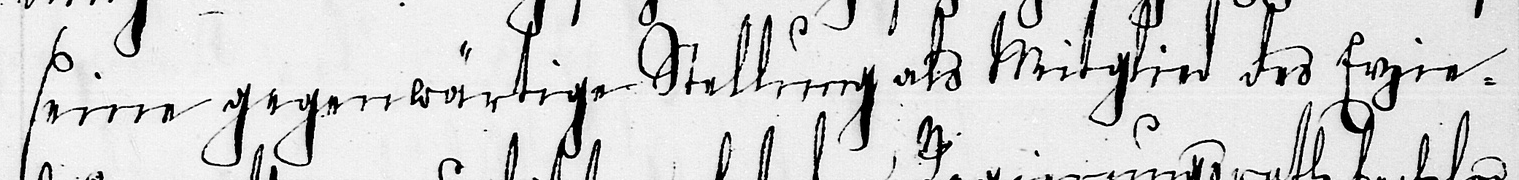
seine gegenwärtige Stellung als Mitglied des Erzie¬
